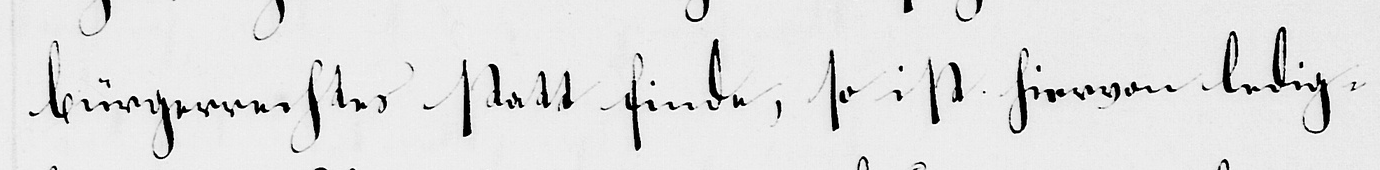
bürgerrechtes statt finde, so ist hiervon ledig¬
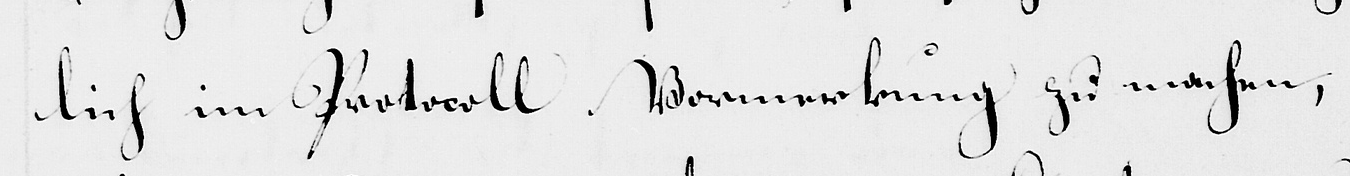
lich im Protocoll Vormerkung zu machen,
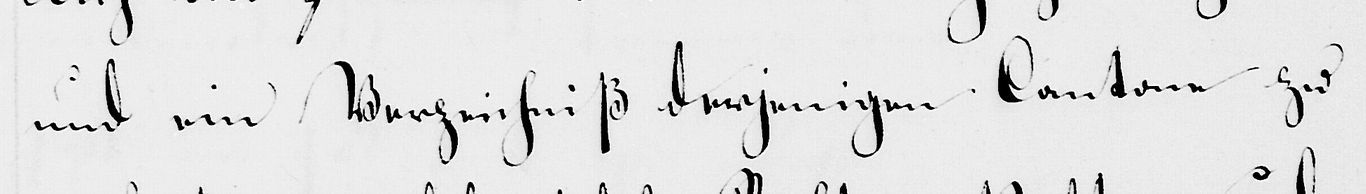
und ein Verzeichniß derjenigen Cantone zu
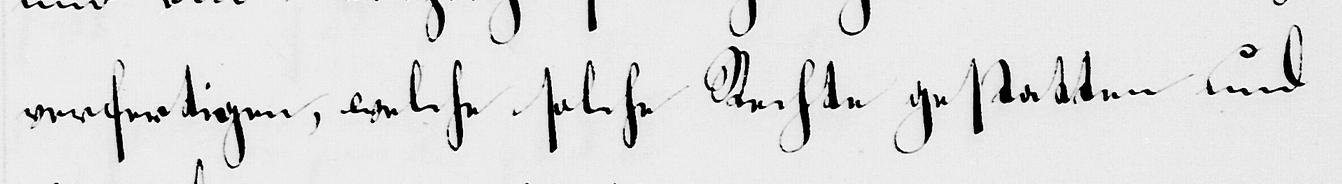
verfertigen, welche solche Rechte gestatten und
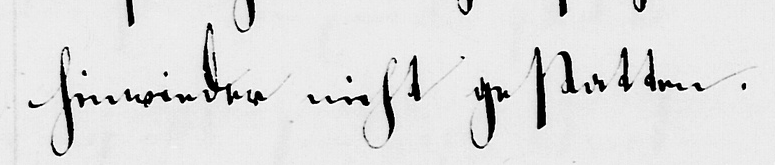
hinwieder nicht gestatten.
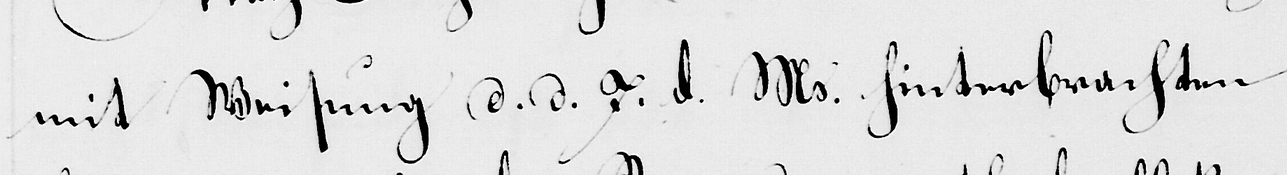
mit Weisung d. d. 7. d. Ms. hinterbrachten
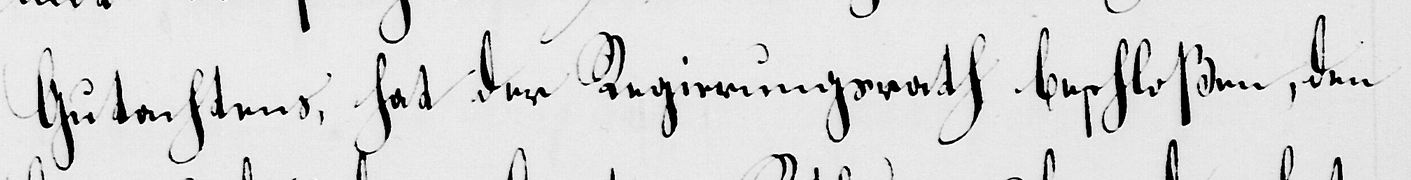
Gutachtens, hat der Regierungsrath beschloßen, den
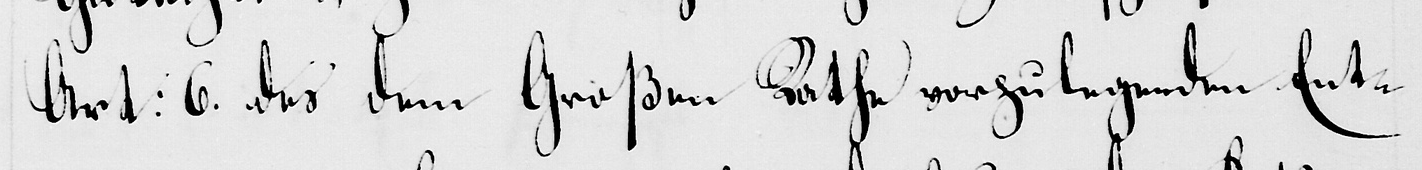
Art: 6. des dem Großen Rathe vorzulegenden Ent¬
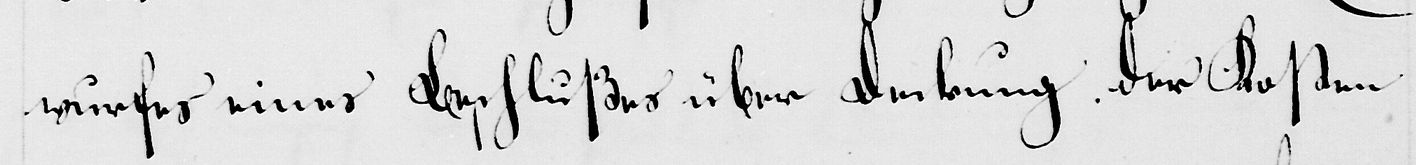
wurfes eines Beschlußes über Deckung der Kosten
